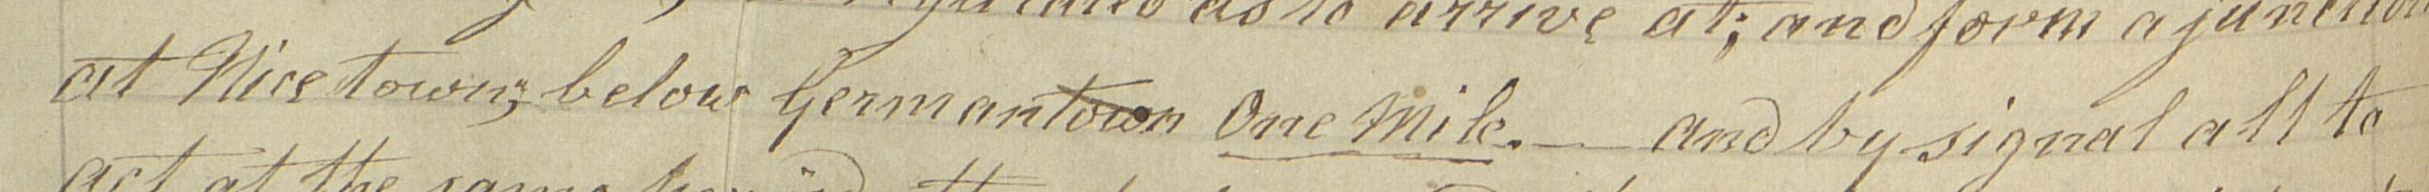at Nice town; below Germantown One Mile. and by signal all to
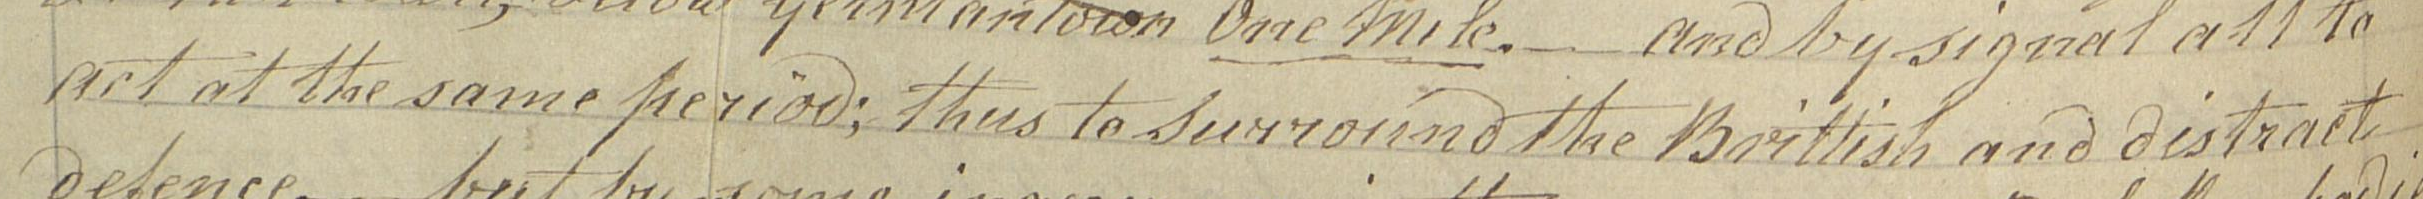act at the same period; thus to surround the Brittish and distract
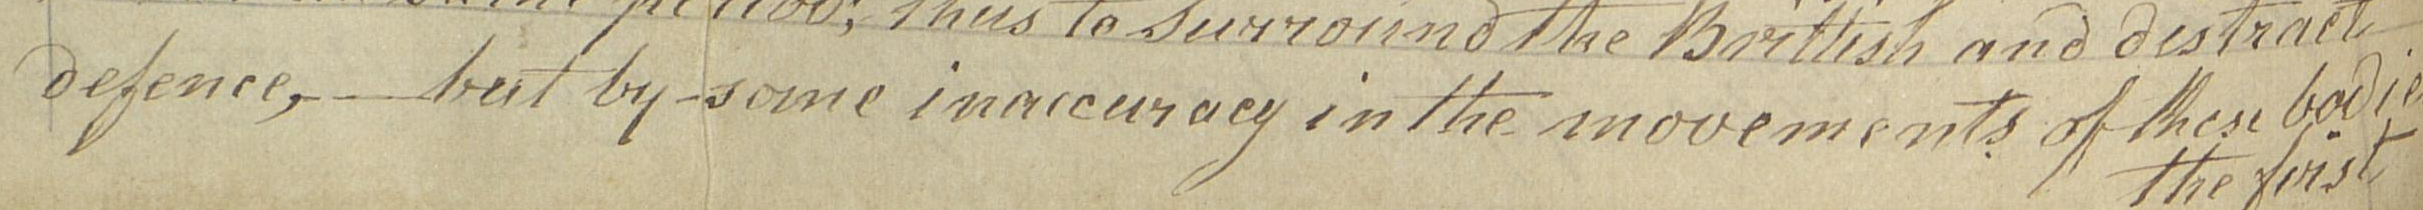defence, but by sone inaccuracy in the movements of these bodies
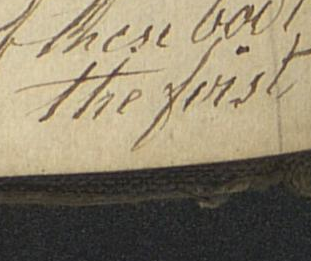the first
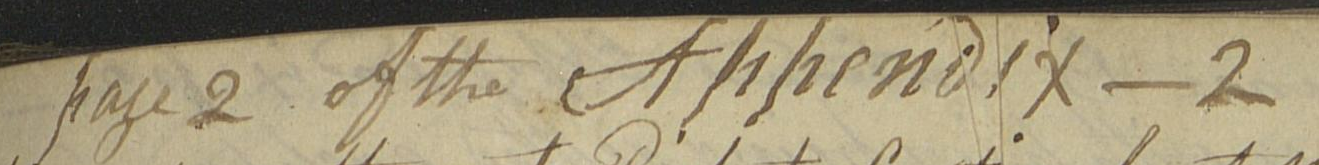page 2 of the Appendix-2
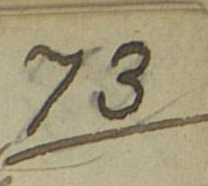73
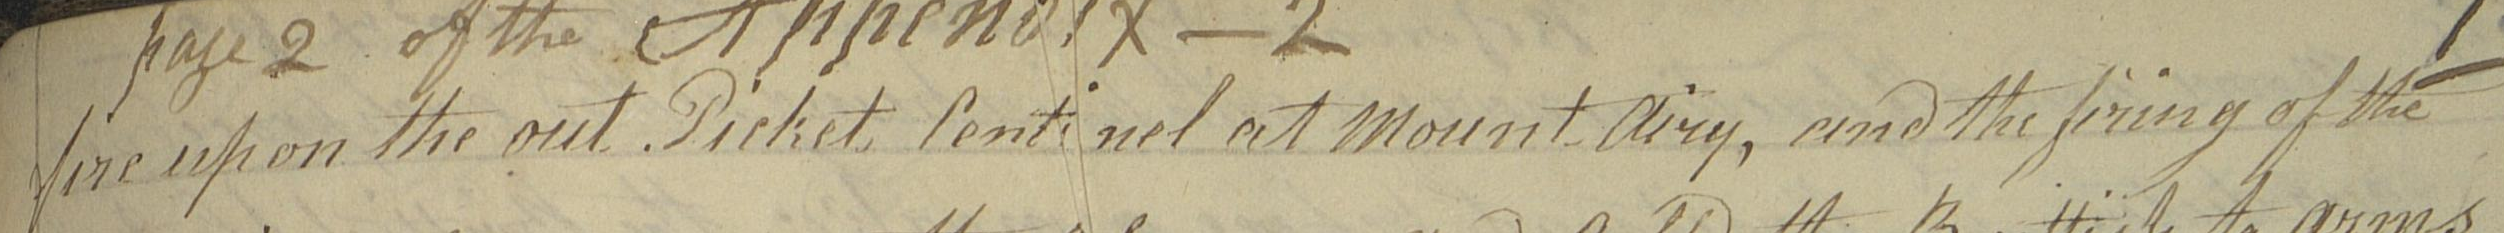fire upon the out Picket, Centinel at Mount Airy, and the firing of the
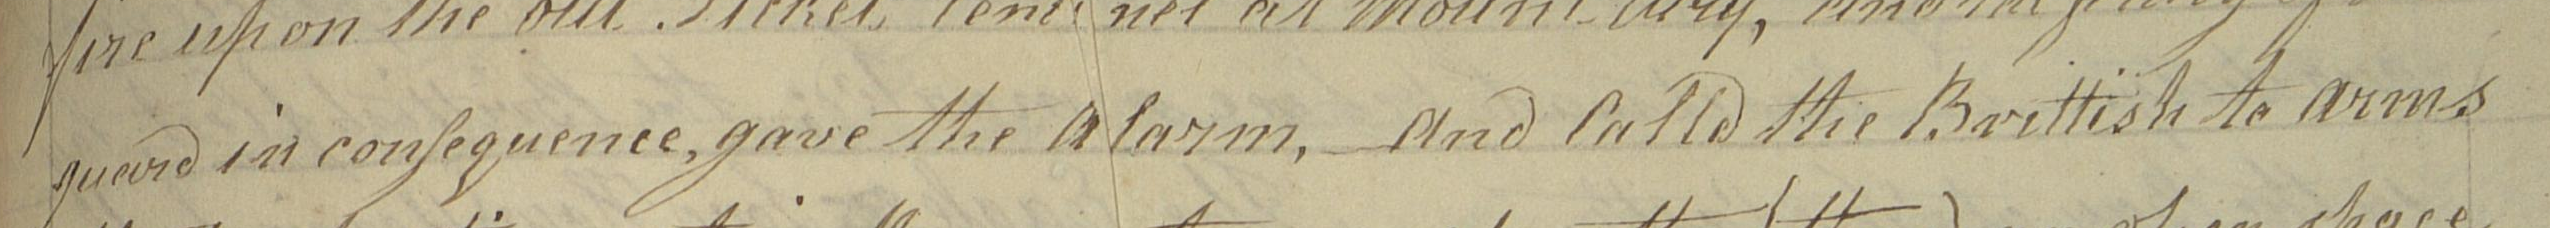guard in consequence gave the Alarm, and Calld the Brittish to Arms
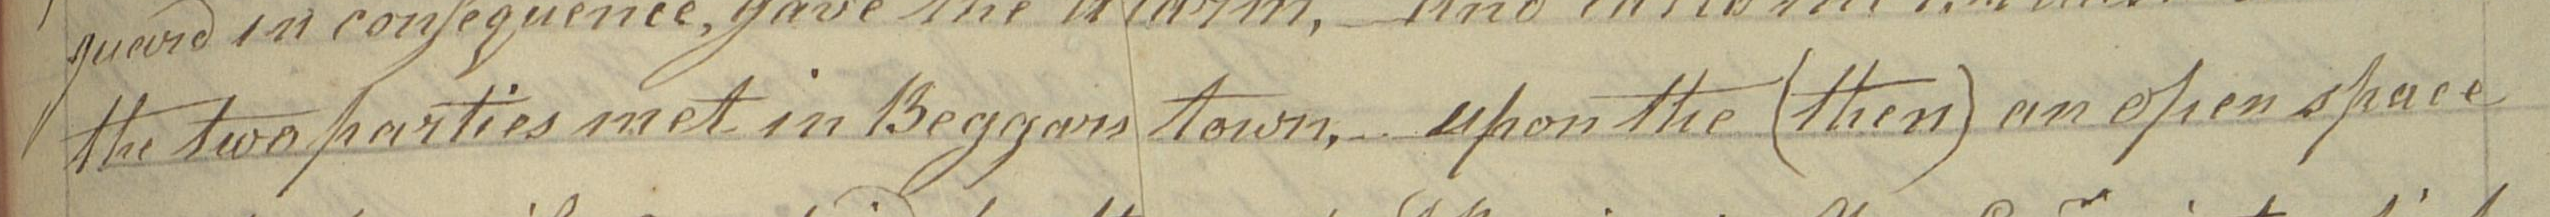the two parties met in Beggars town, upon the (then) an open space
